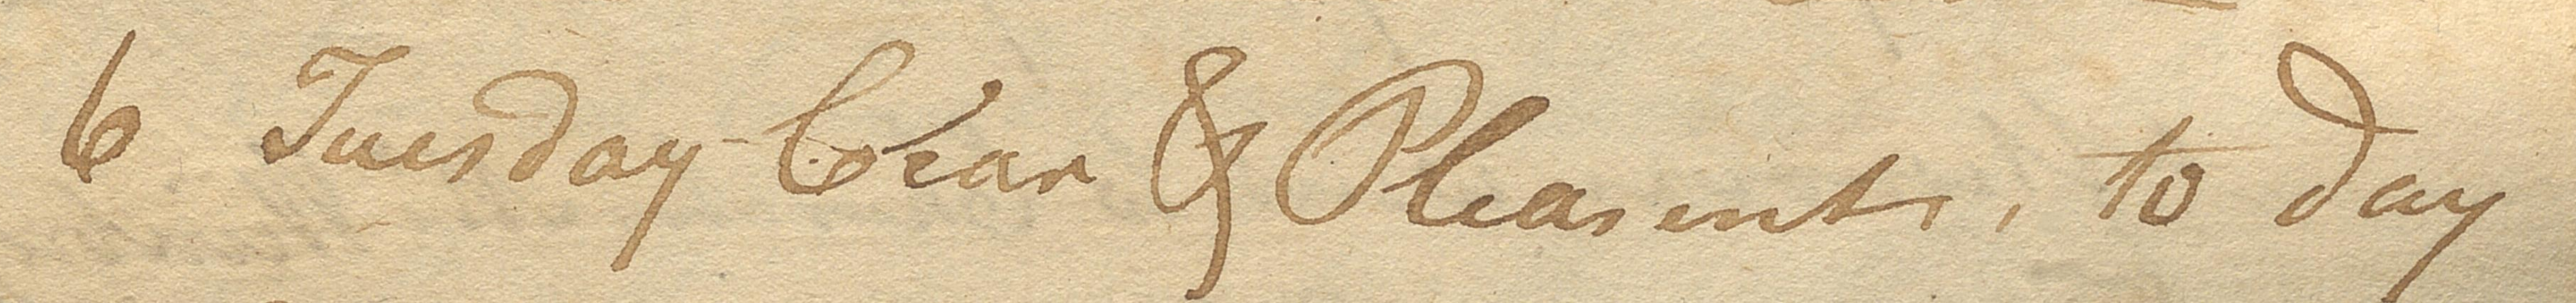6 Tuesday Clear & Pleasent, to day
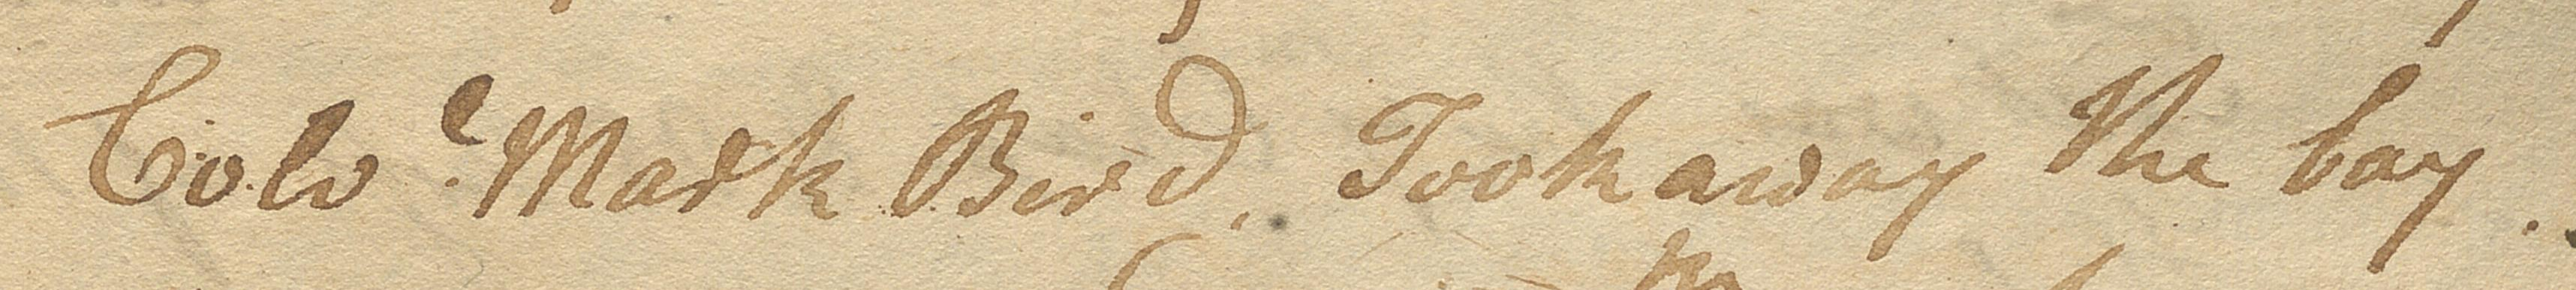Colo^l. Mark Bird Took away the bay
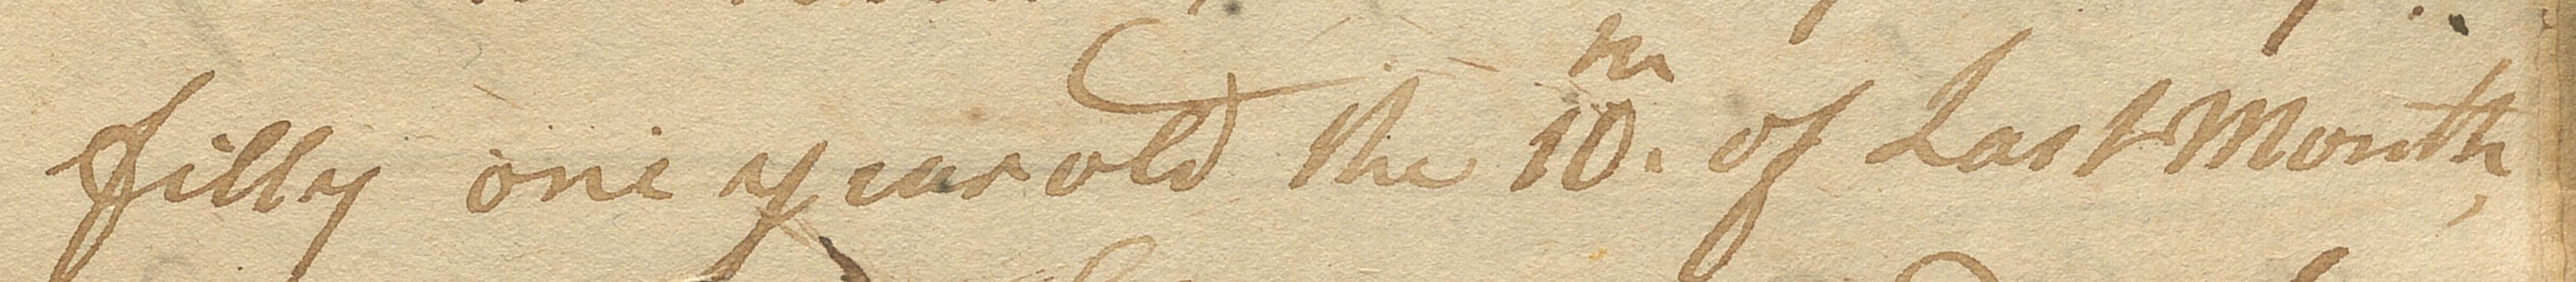filly one year old the 10^th. of Last Month
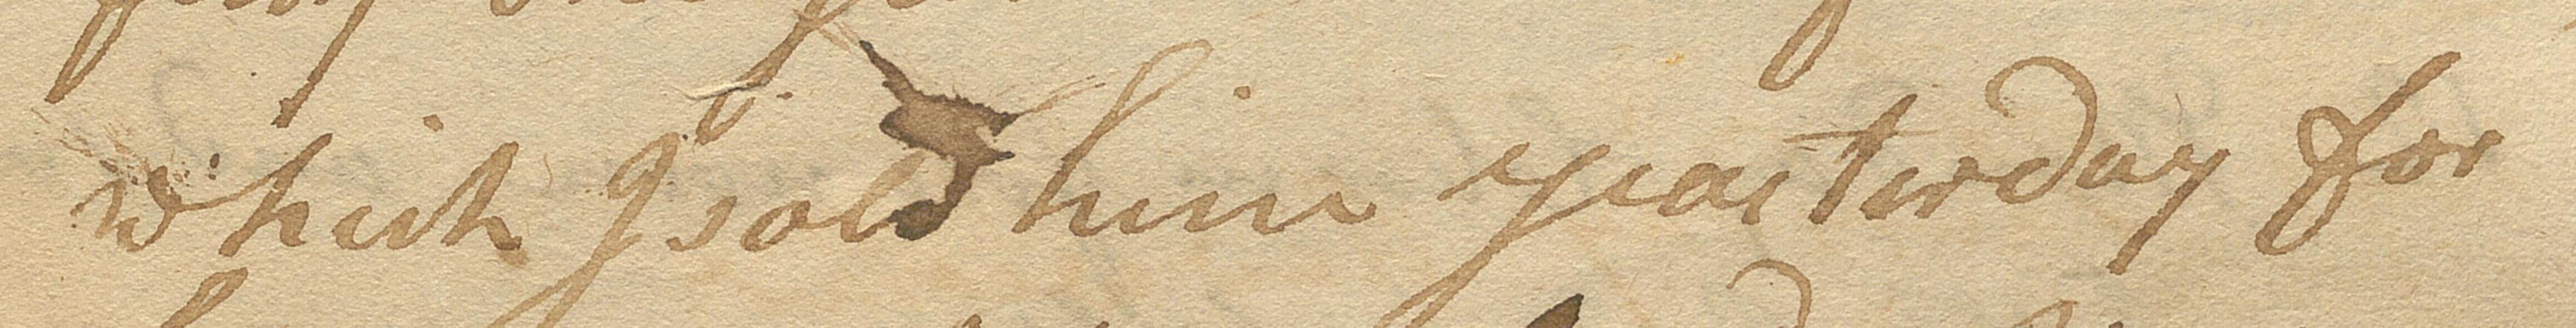which I sold him yeasterday for
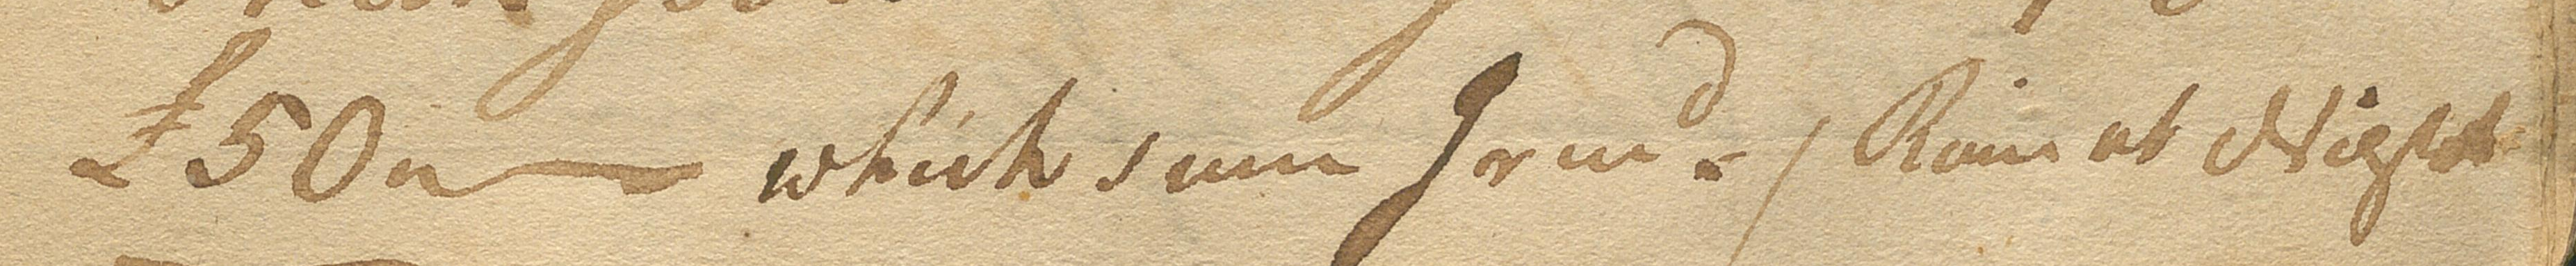£50- which sum I rec^d. / Rain at Night
